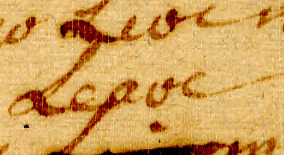Leave
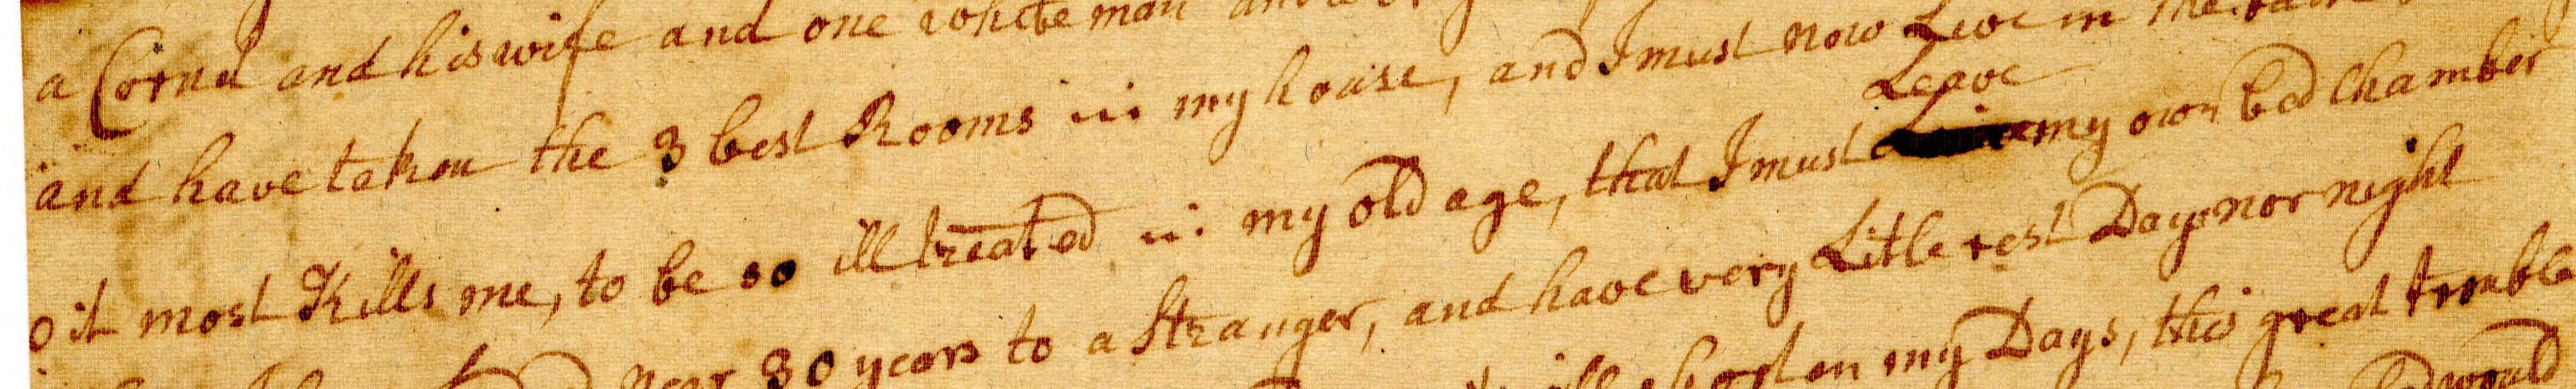O it most Kills one, to be so illtreated in my old age, that I must [____] my own bed Chamber
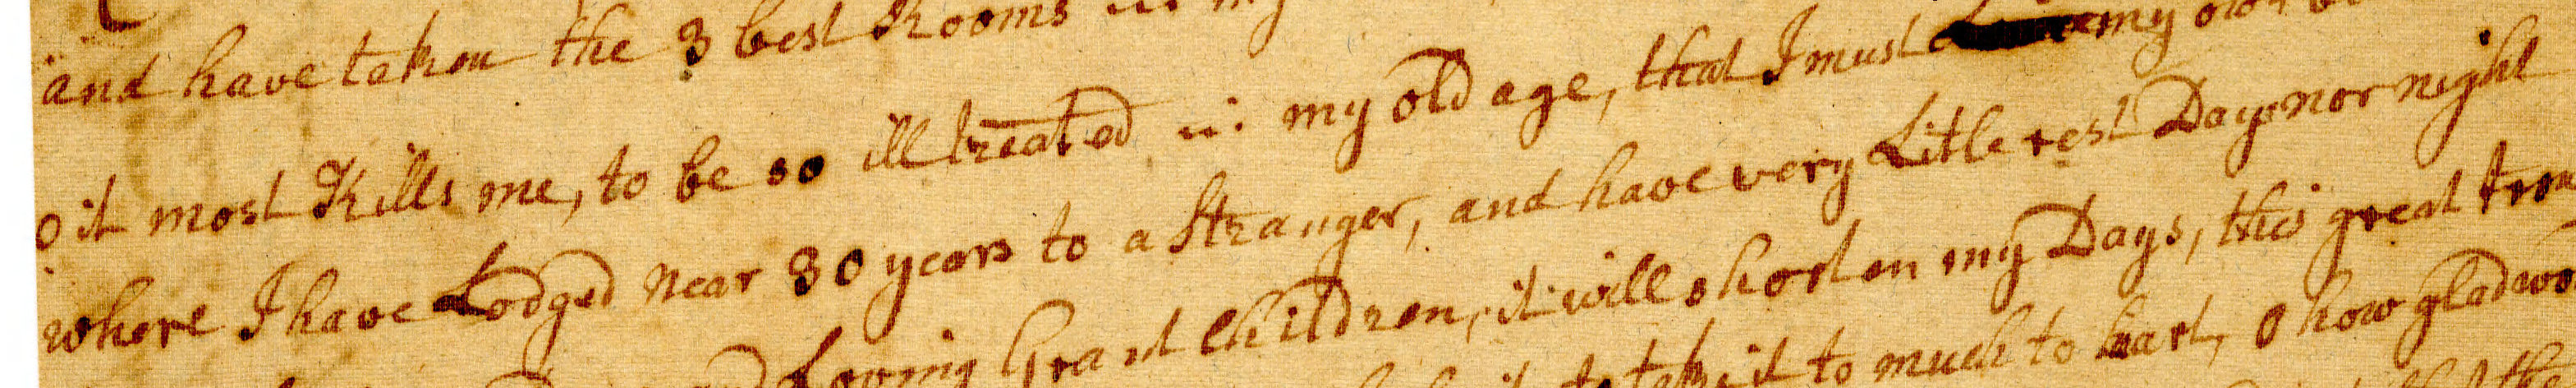where I have Lodged near 30 years to a Stranger, and have very Litle rest Day nor night
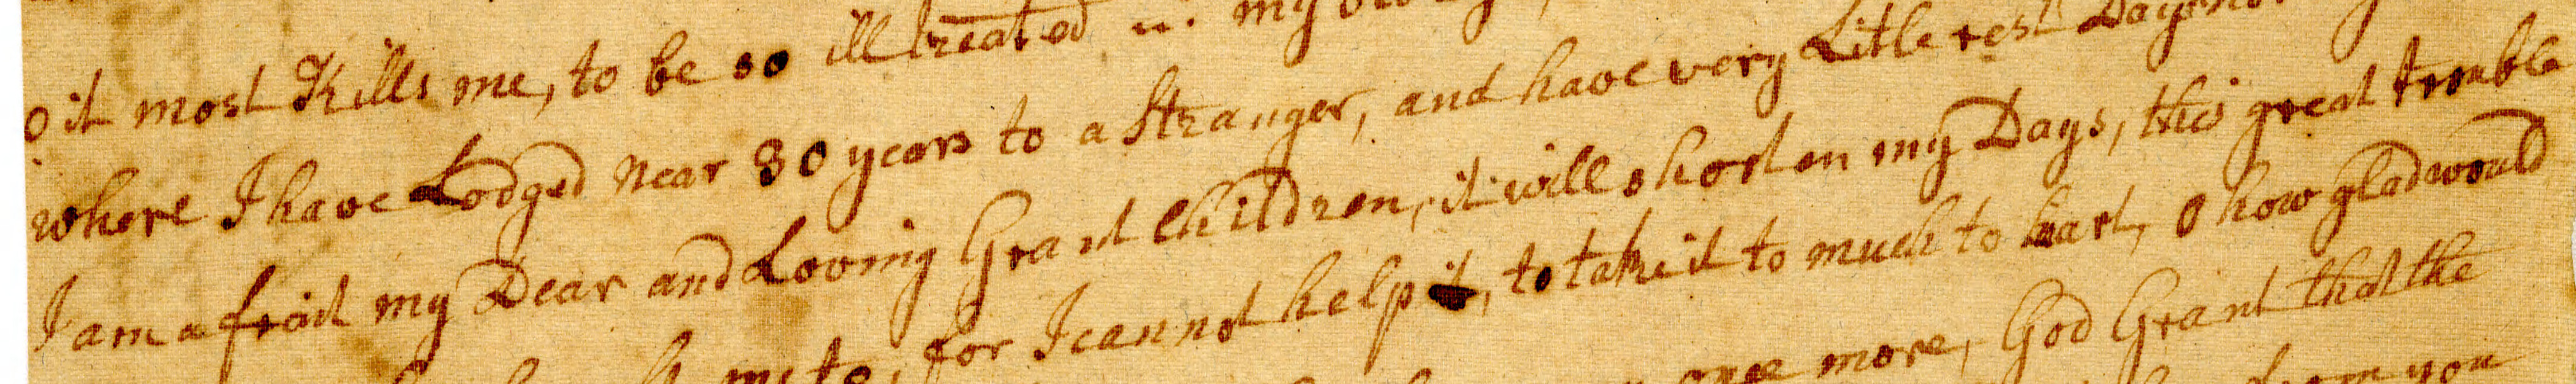I am afrait my Dear and Loving Grant Children, it will shorten my Days, this great trouble
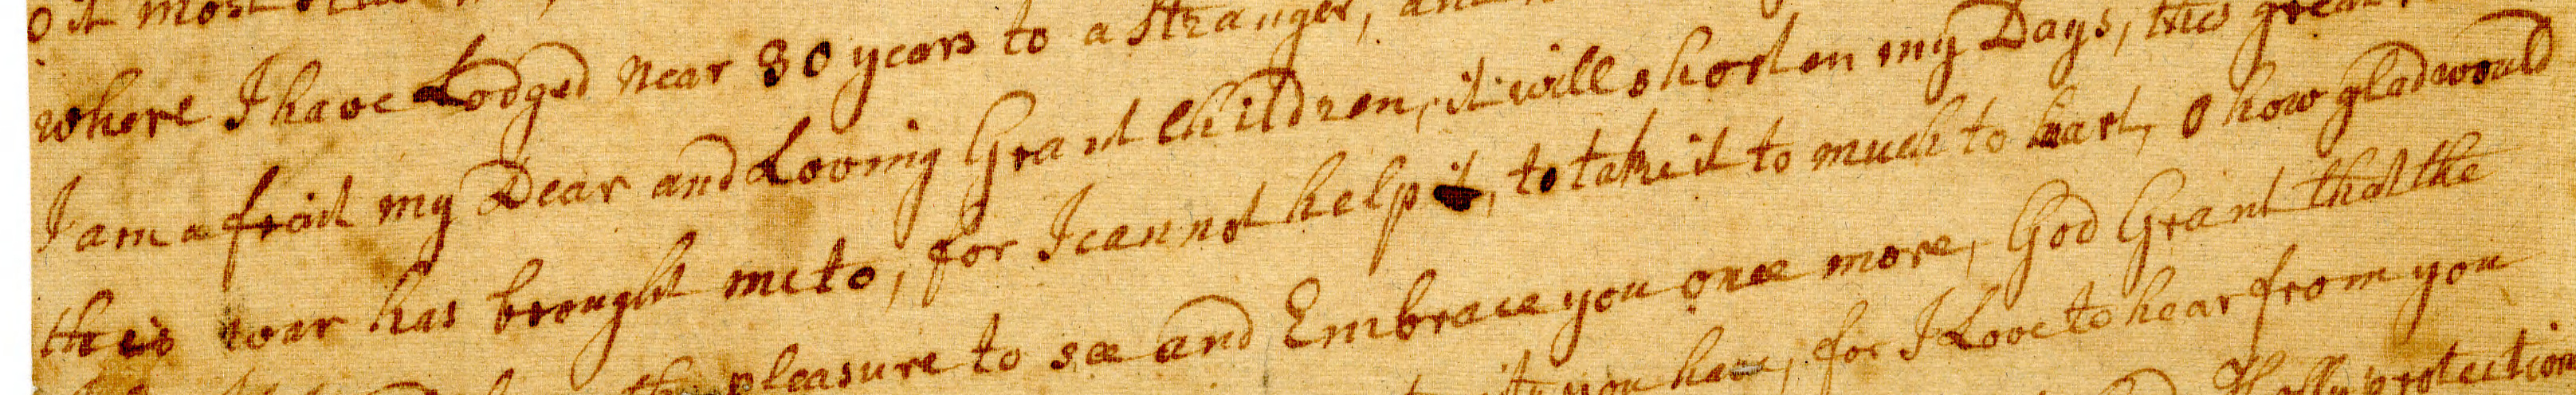this war has brought me to, for I can not help, to take it to much to Early, O how glad would
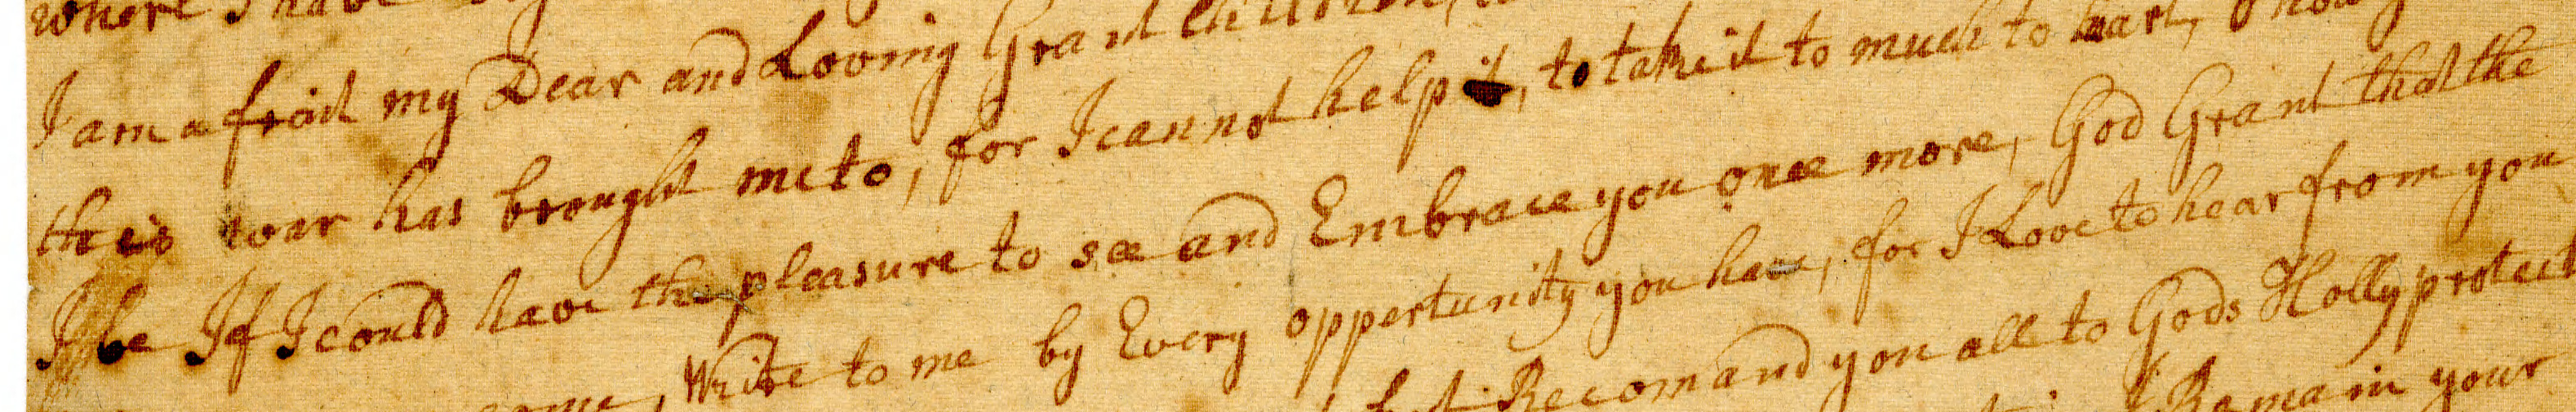I be If I could have the pleasure to see and Embrace you once more, God Grant that the
